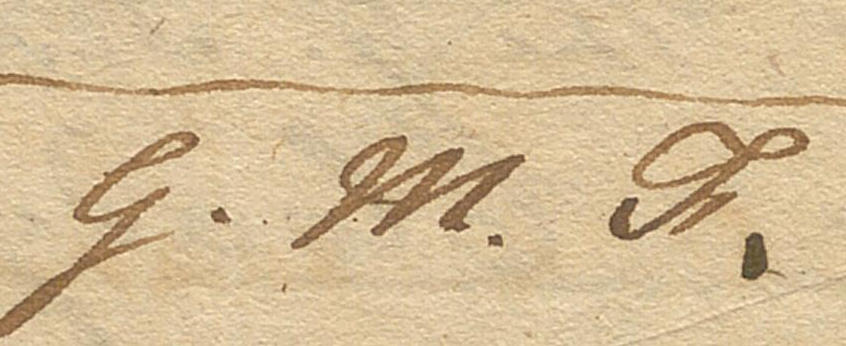G. M. F.
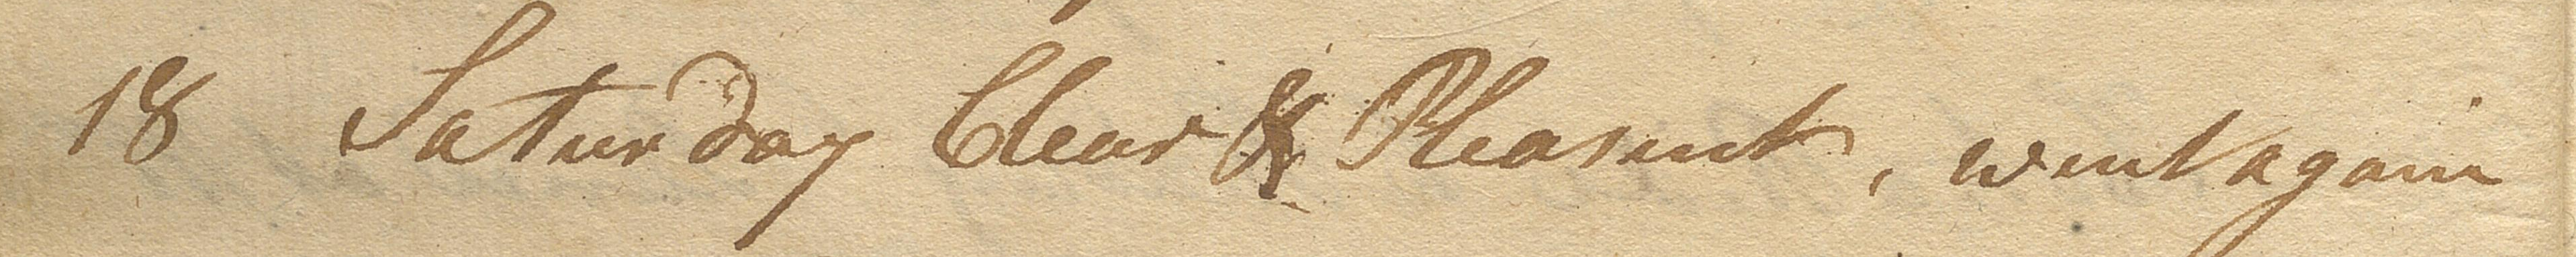18 Saturday Clear & Pleasent, went again
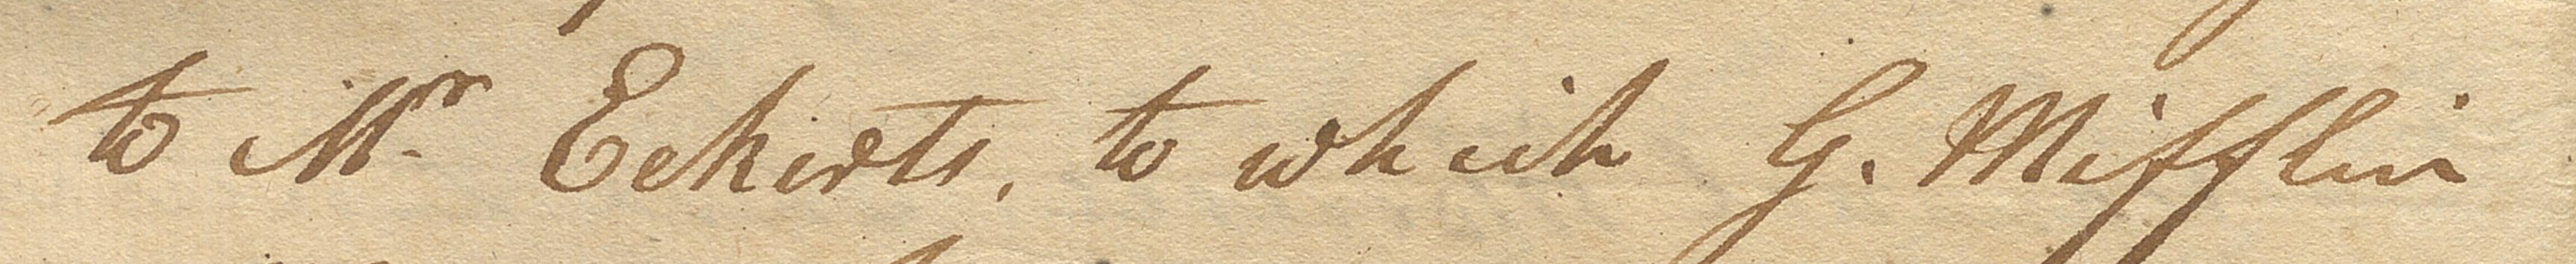to M^r. Eckerts, to which G. Mifflin
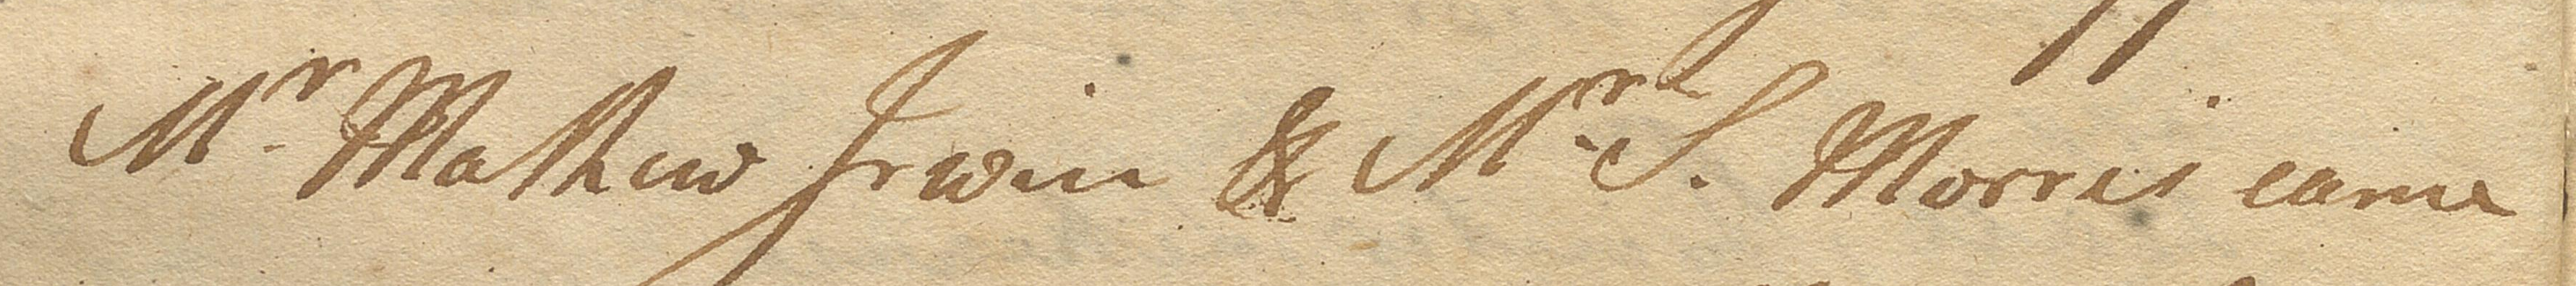M^r. Mathew Irwin & M^r. S. Morris came
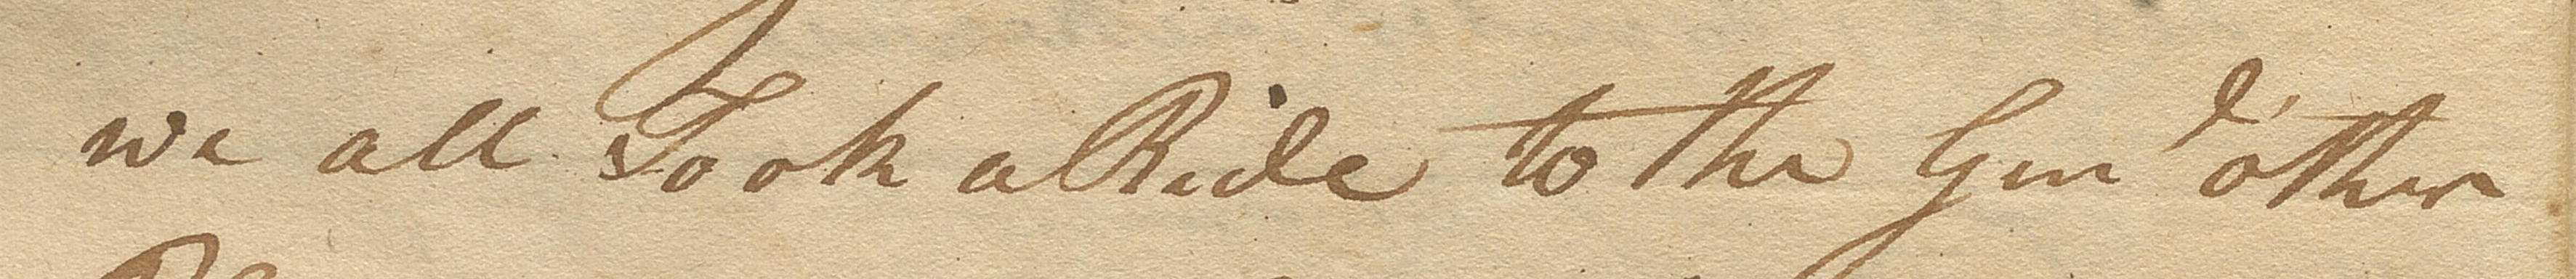we all Took a Ride to the Gen^l other
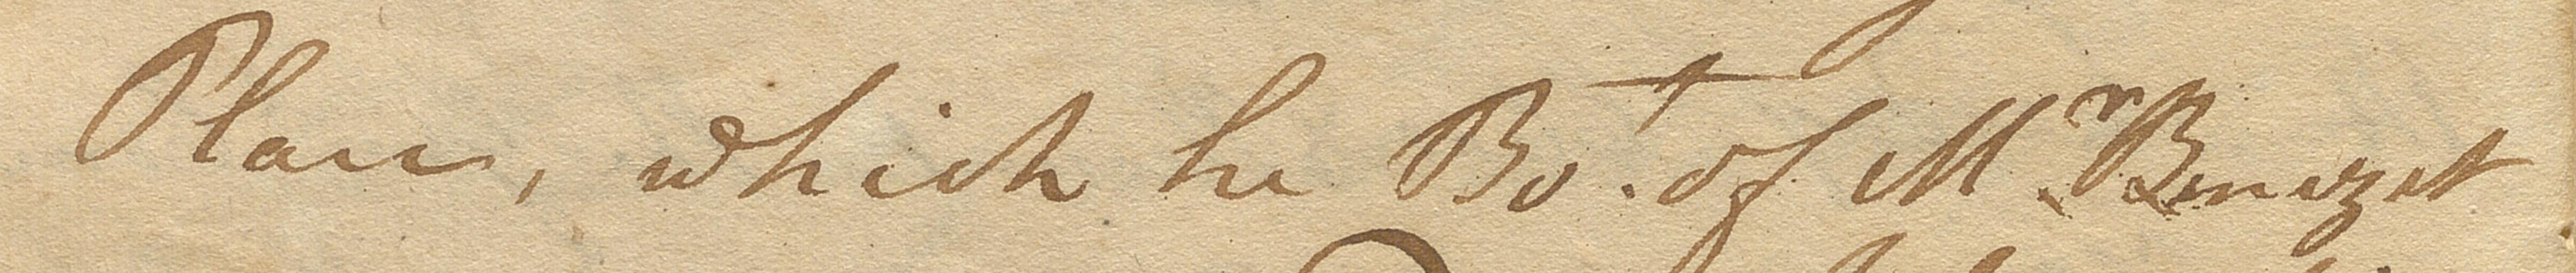Place, which he Bo^t. of M^r. Benezet
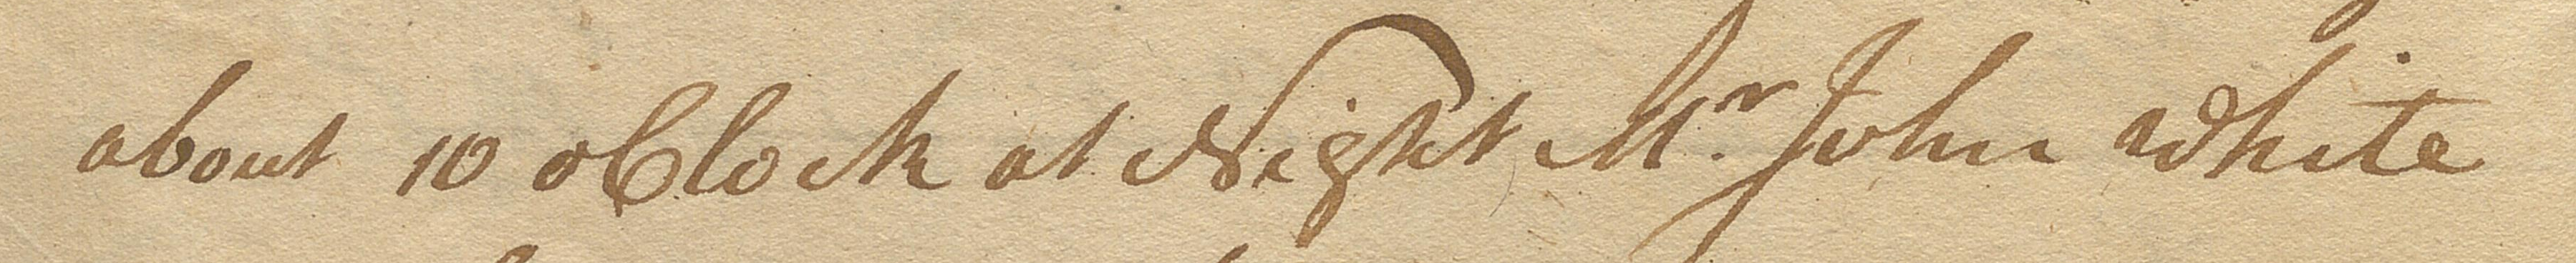about 10 oClock at Night M^r. John white
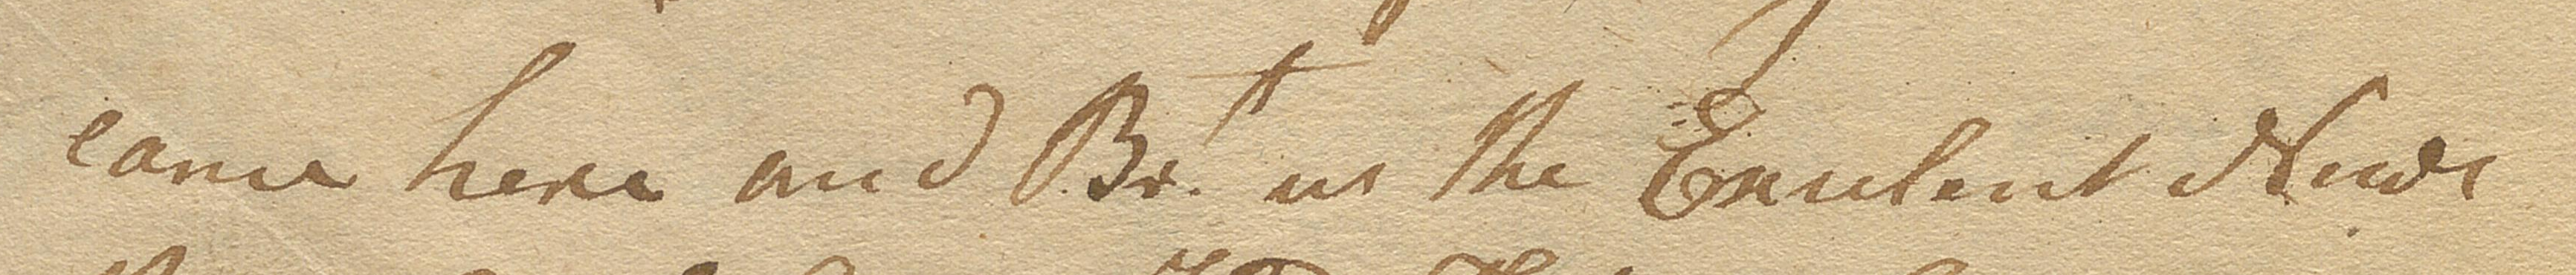came here and Br^t. us the Excelent News
